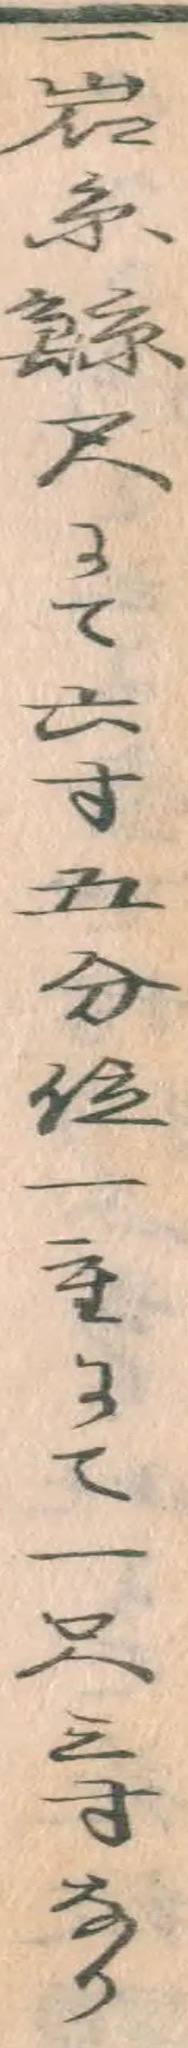一岩糸鯨尺にて六寸五分位一重にて一尺三寸なり
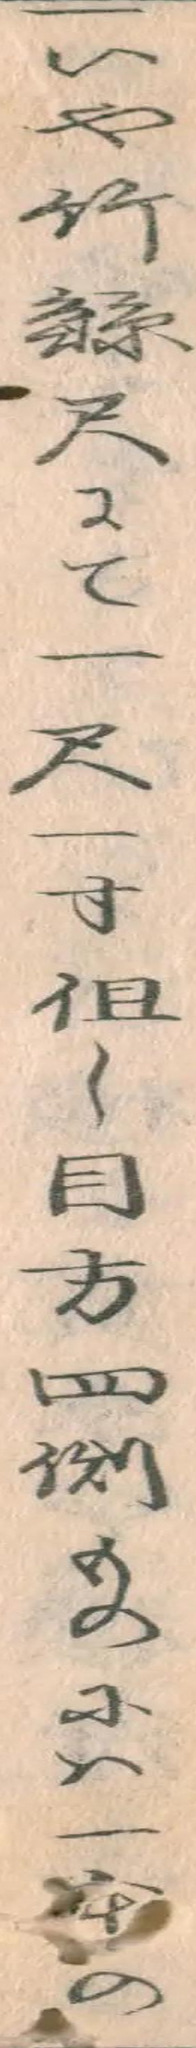一いや竹鯨尺にて一尺一寸但し目方四側ものには一本の
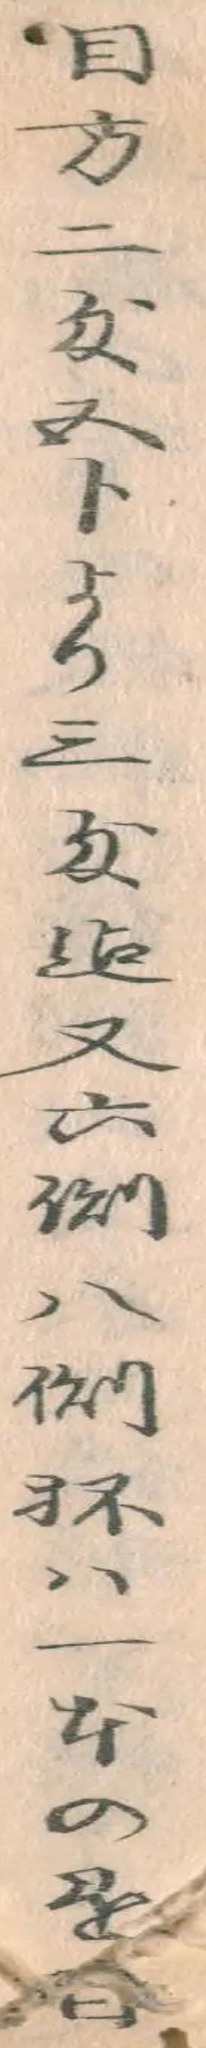目方二匁五分より三匁迄又六側八側抔は一本の懸目
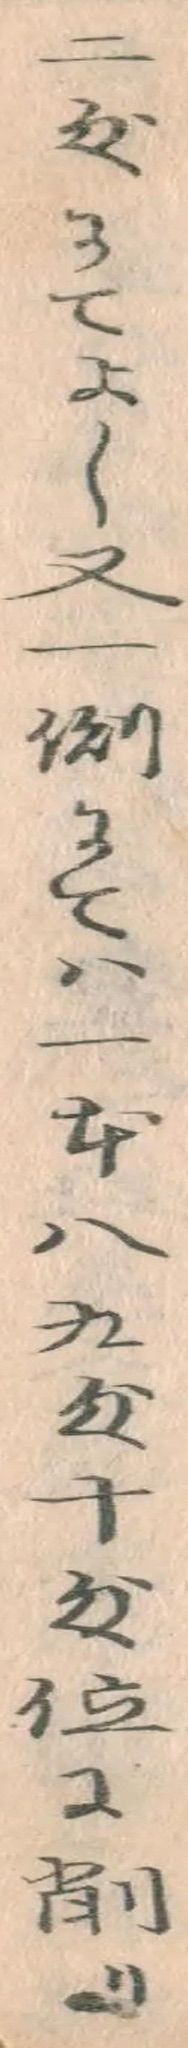二匁にてよし又一側にては一本八九匁十匁位に削り
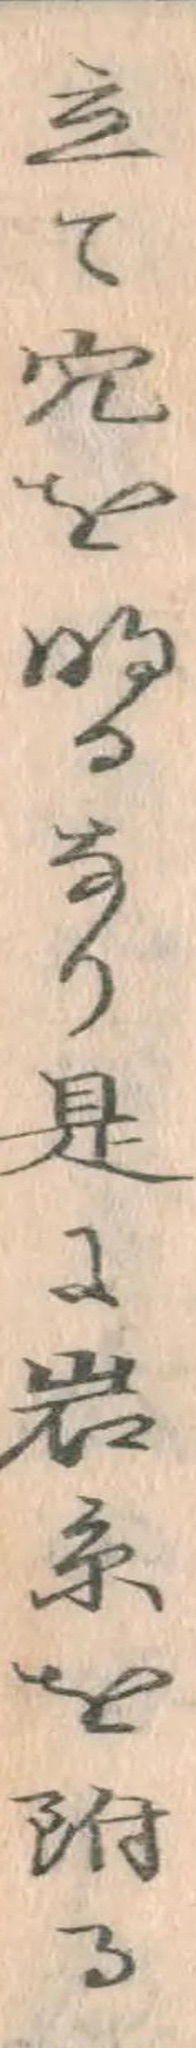立て穴を明るなり是に岩糸を附る
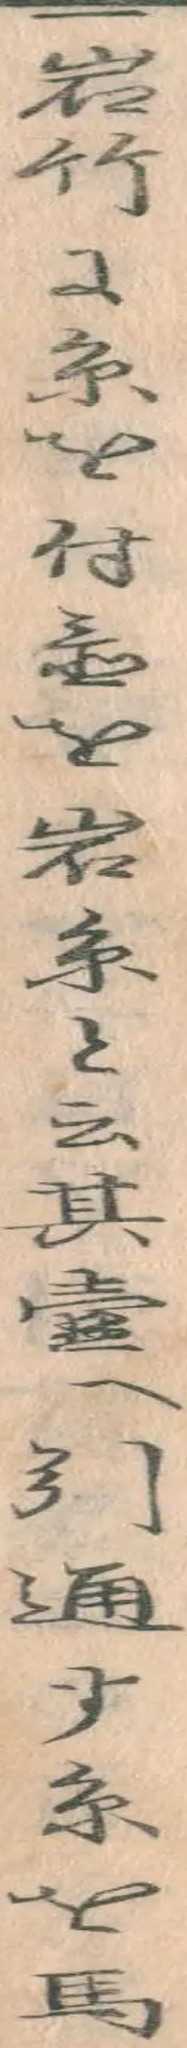一岩竹に糸を付置を岩糸と云其壺へ引通す糸を馬

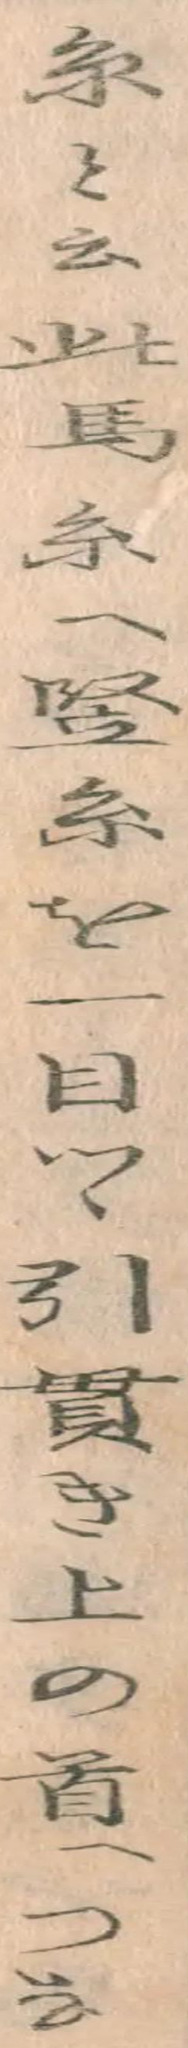糸と云此馬糸へ竪糸を一目つゝ引貫き上の首へつな
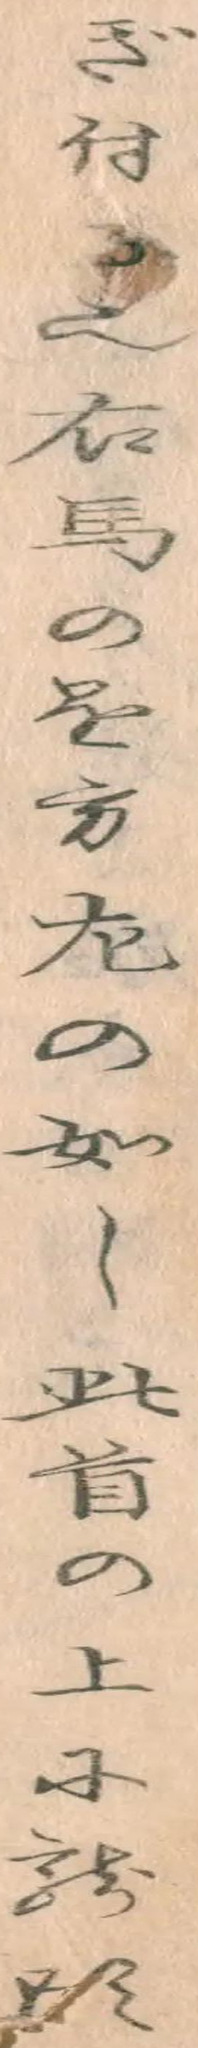ぎ付る也右馬の懸方左の如し此首の上に竜頭
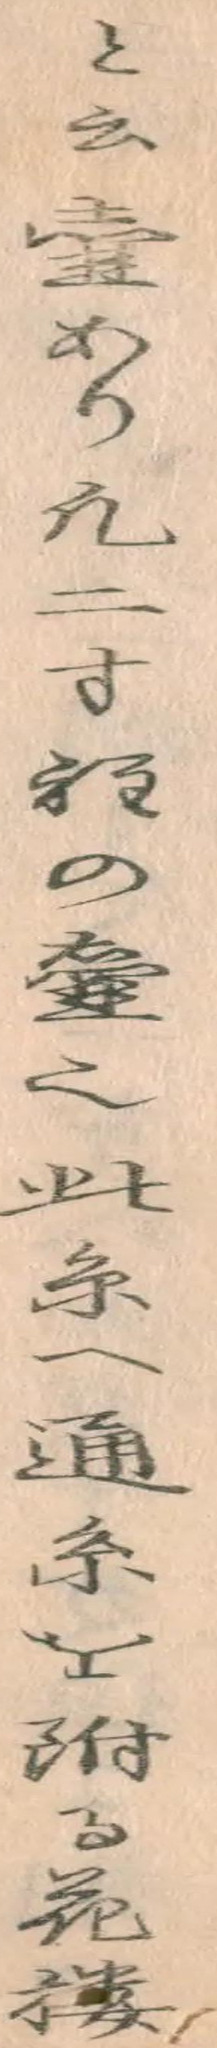と云壺あり凡二寸程の壺也此糸へ通糸を附る花楼
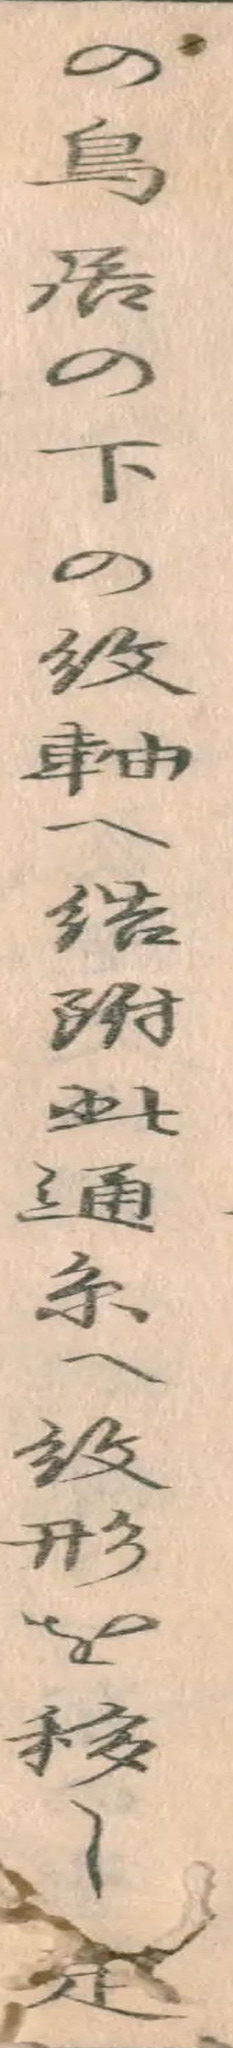の鳥居の下の紋軸へ結附此通糸へ紋形を移し是
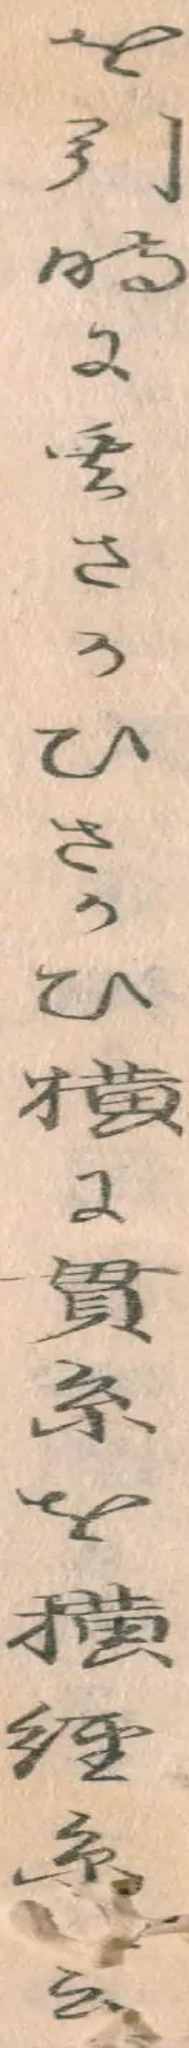を引時に其さかひさかひ横に貫糸を横経糸と云
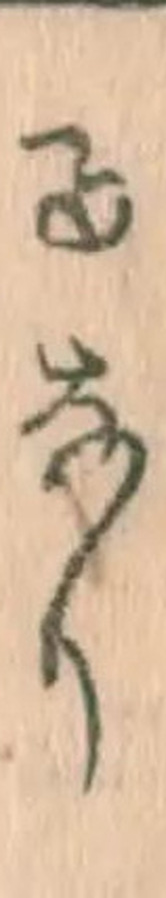るなり
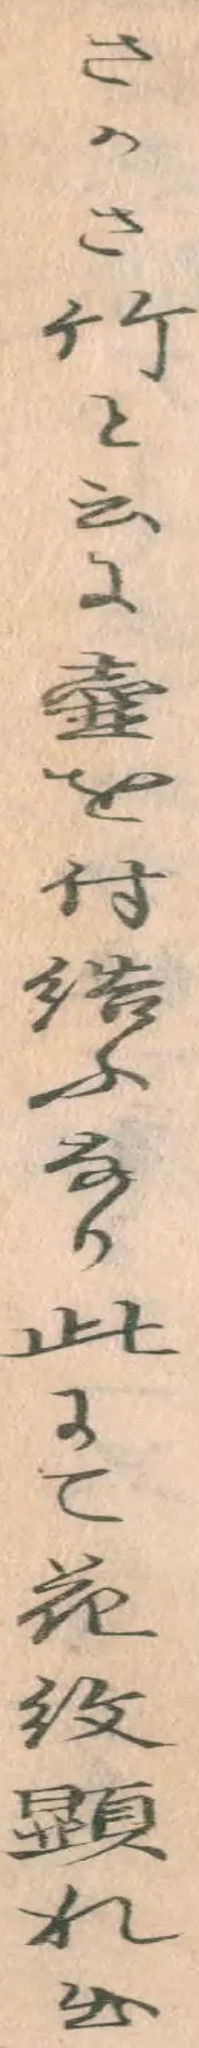さかさ竹と云に壺を付結ふなり此にて花紋顕れ出
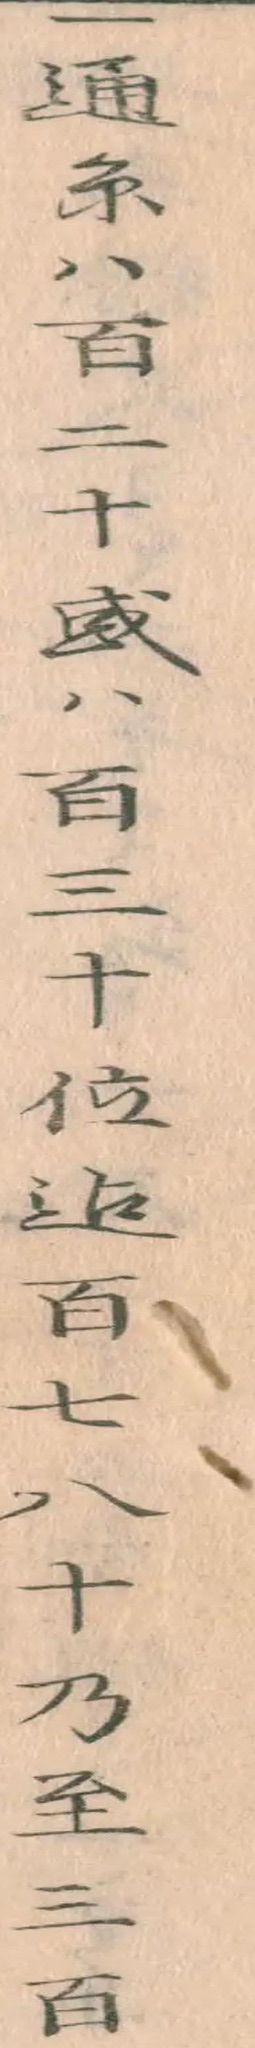一通糸は百二十或は百三十位迄百七八十乃至三百
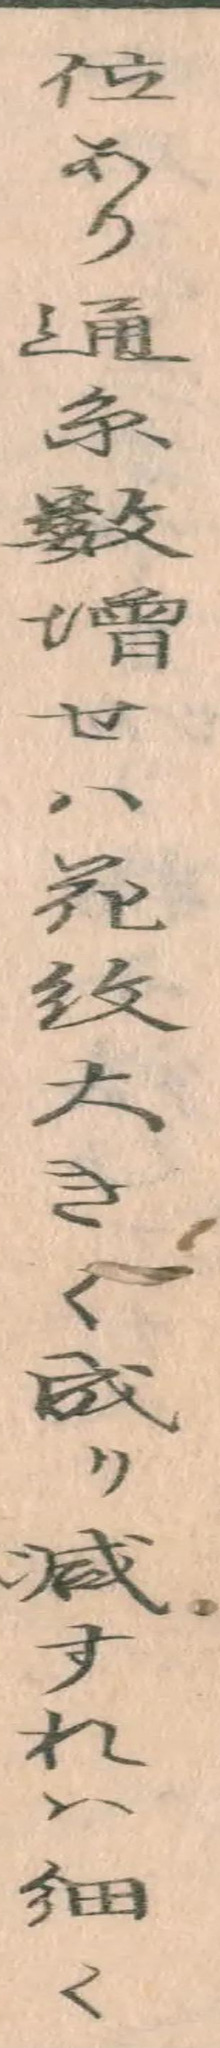位あり通糸数増せは花紋大きく成り減すれは細く
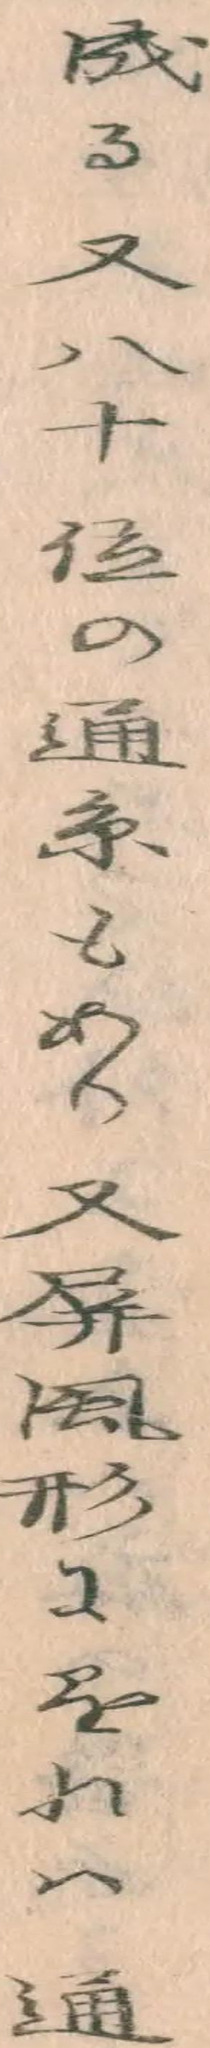成る又八十位の通糸もあり又屏風形に懸れは通
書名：機織彙編 5巻. [2]
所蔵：国立国会図書館 National Diet Library, JAPAN
